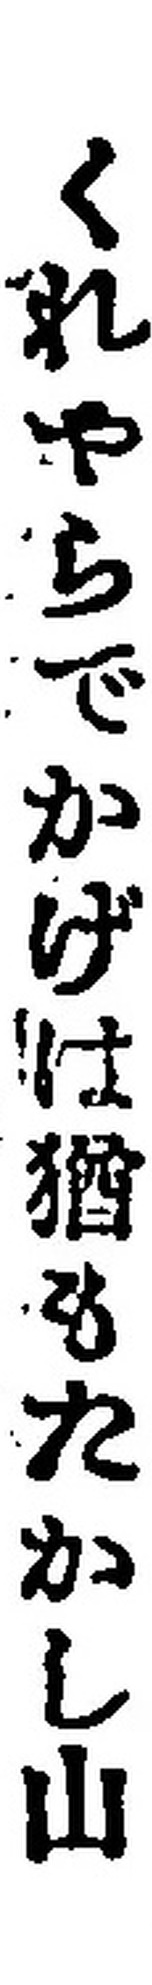くれやらでかげは猶もたかし山
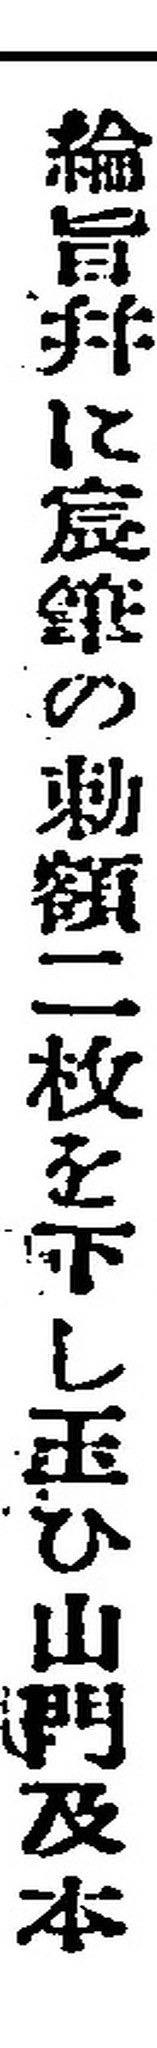綸旨并に宸筆の勅額二枚を下し玉ひ山門及本
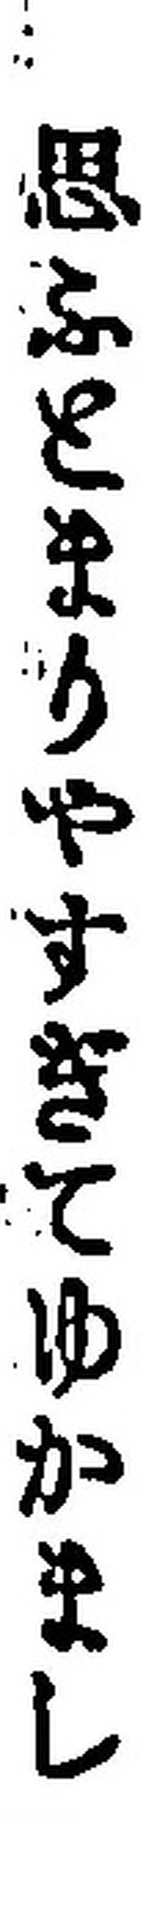思ふとまりやすぎてゆかまし
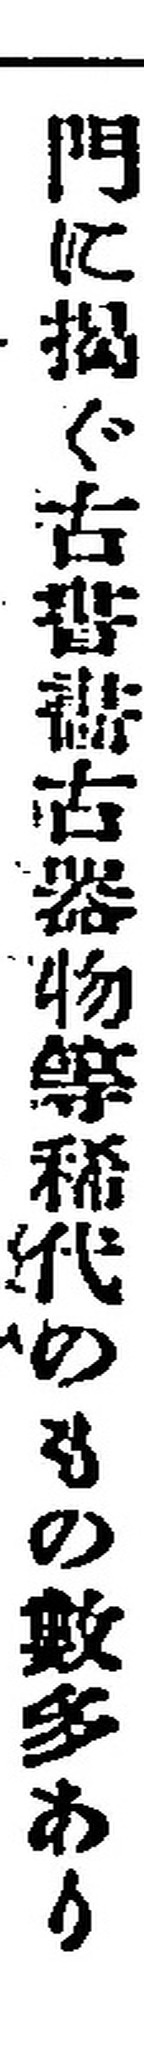門に掲ぐ古書画古器物等稀代のもの数多あり
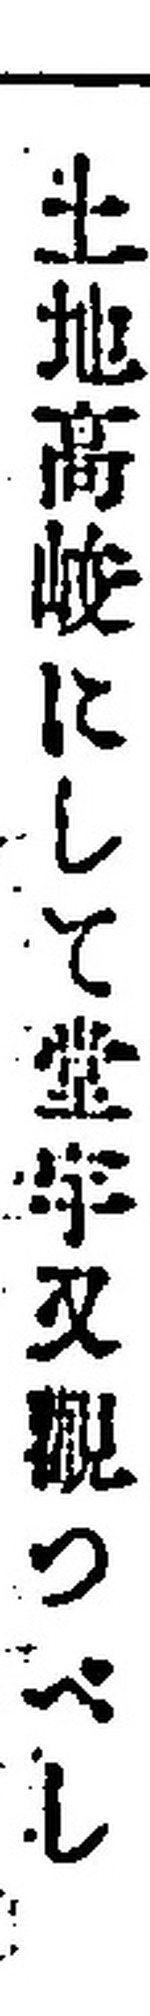土地高峻にして堂宇又観つべし
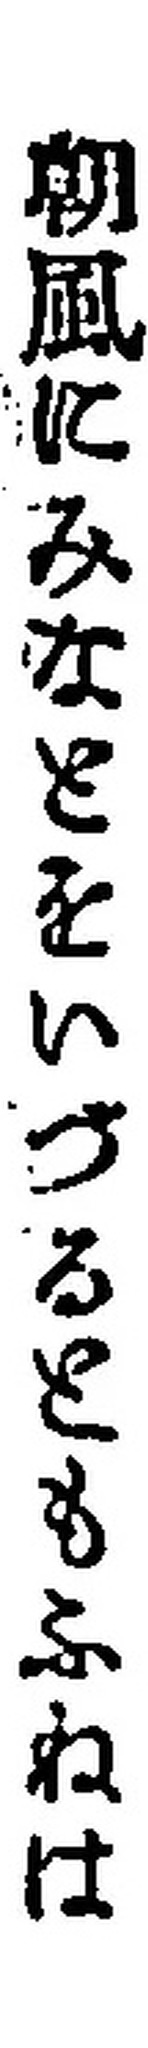朝風にみなとをいづるともふねは
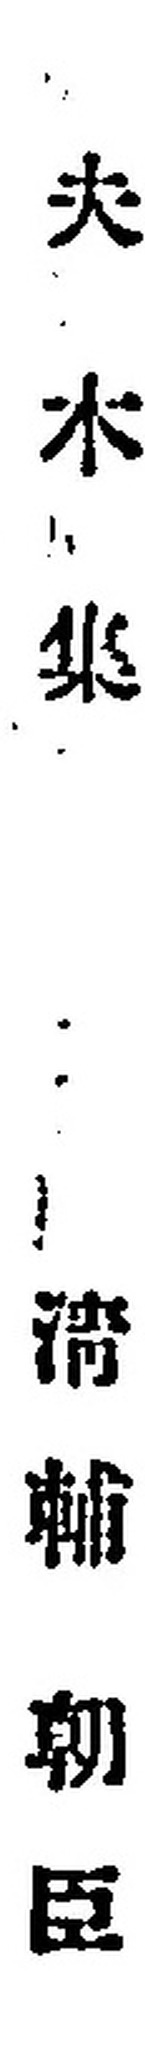夫木集清輔朝臣
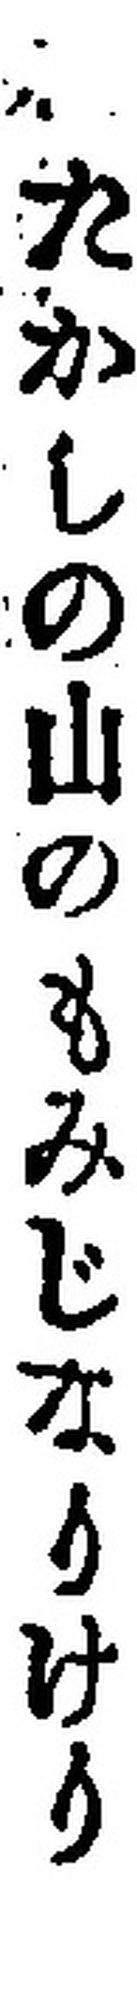たかしの山のもみじなりけり
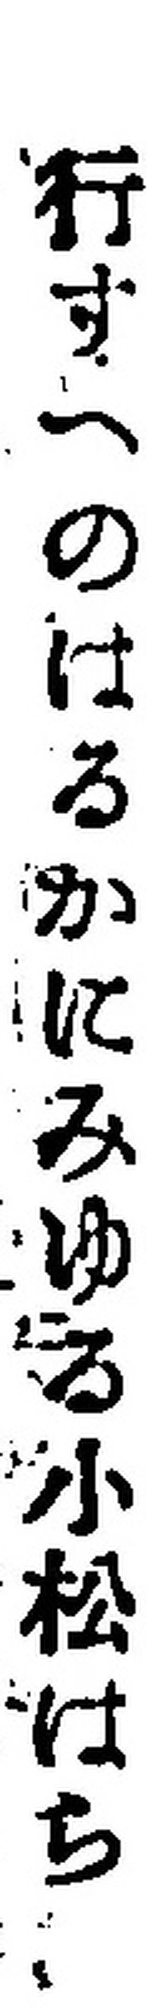行すへのはるかにみゆる小松はち
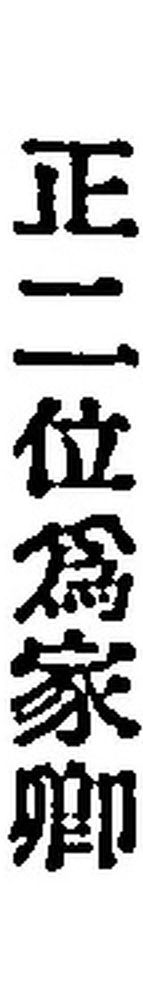仝正二位為家卿
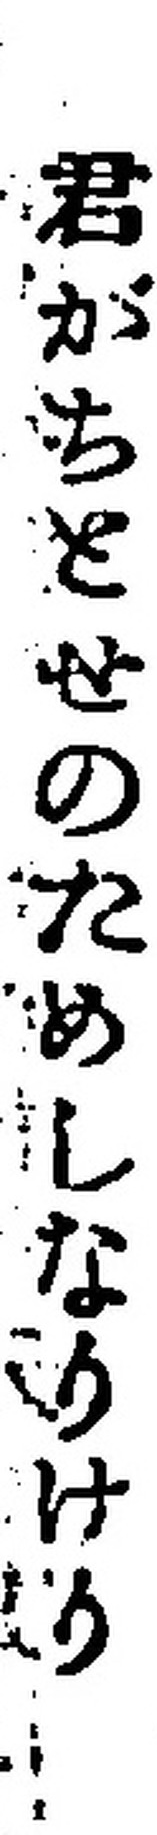君がちとせのためしなりけり
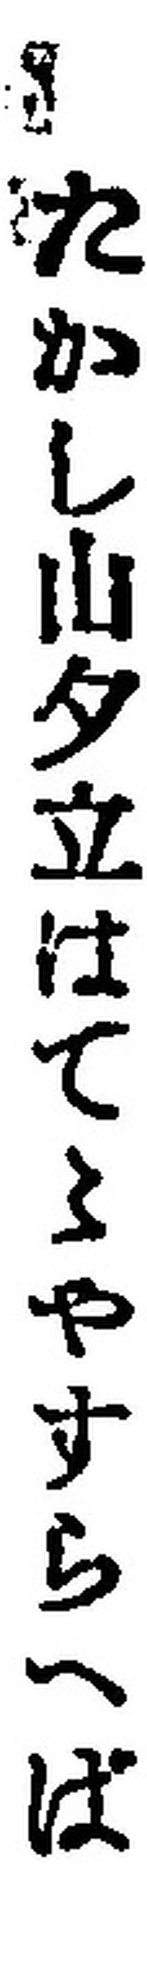たかし山夕立はてゝやすらへば
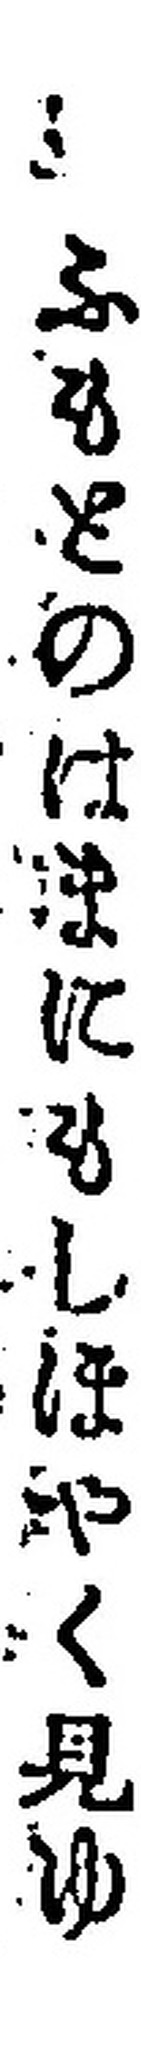ふもとのはまにもしほやく見ゆ
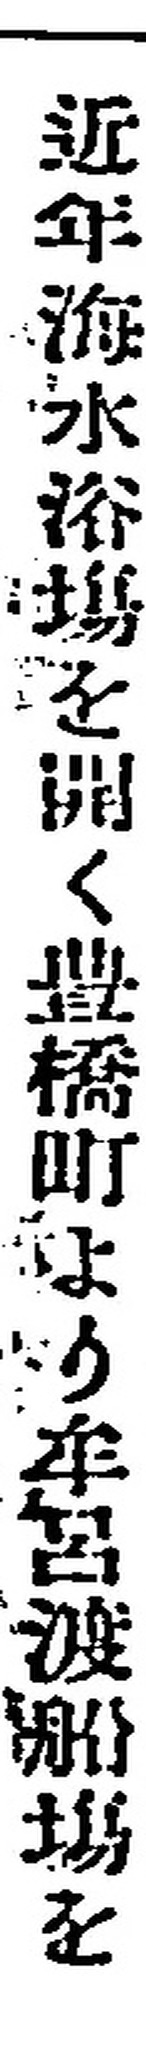近年海水浴場を開く豊橋町より牟呂渡船場を
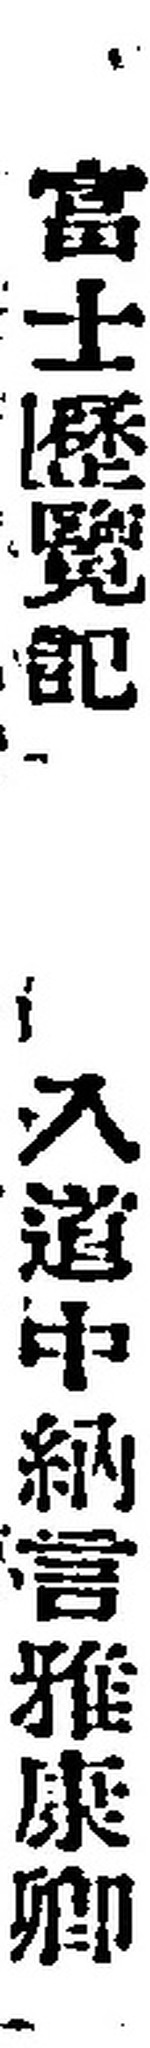富士歴覧記入道中納言雅康卿
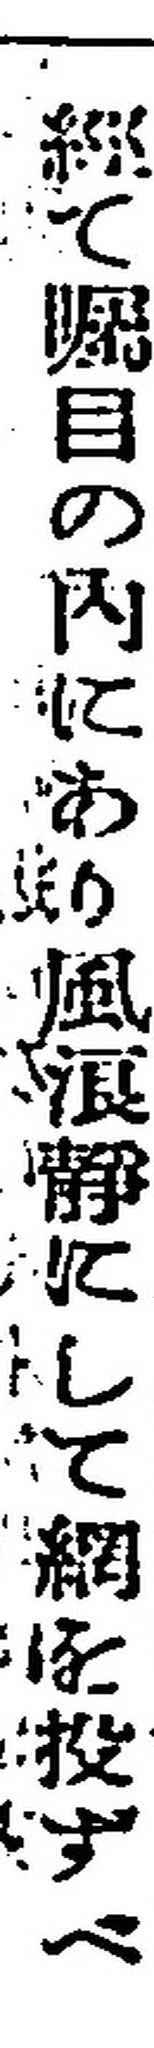経て嘱目の内にあり風浪静にして網を投ずべ
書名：東参名勝案内
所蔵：国立国会図書館 National Diet Library, JAPAN
